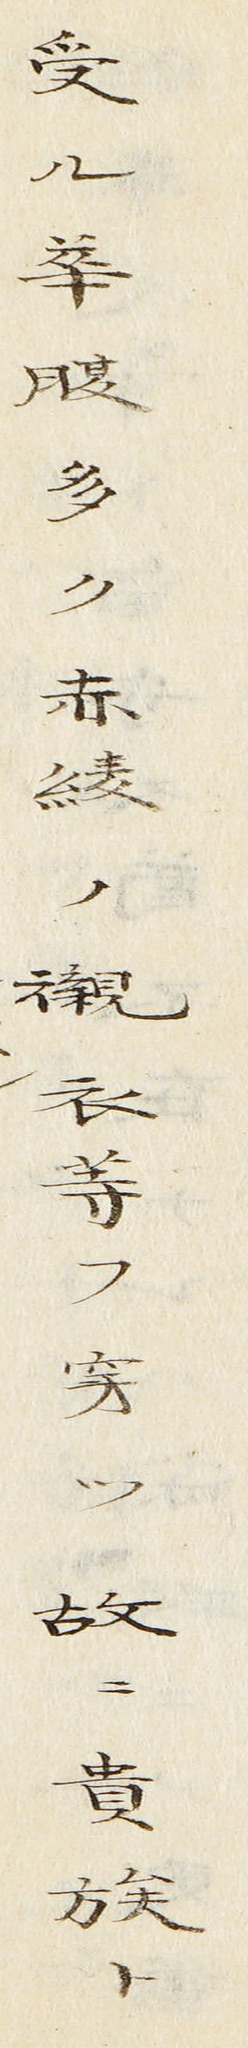受ル華腹多ク赤綾ノ襯衣等フ穿ツ故ニ貴族ト
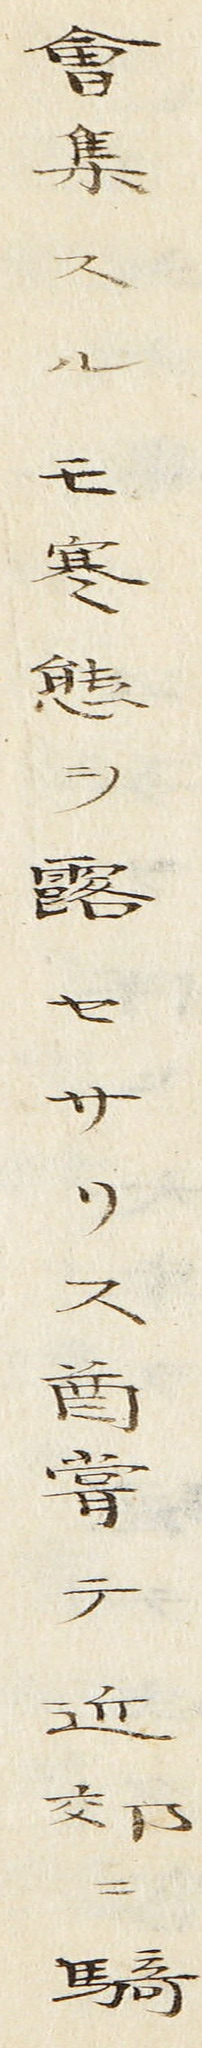会集スルモ寒態ヲ露セサリス酋嘗テ近郊ニ騎
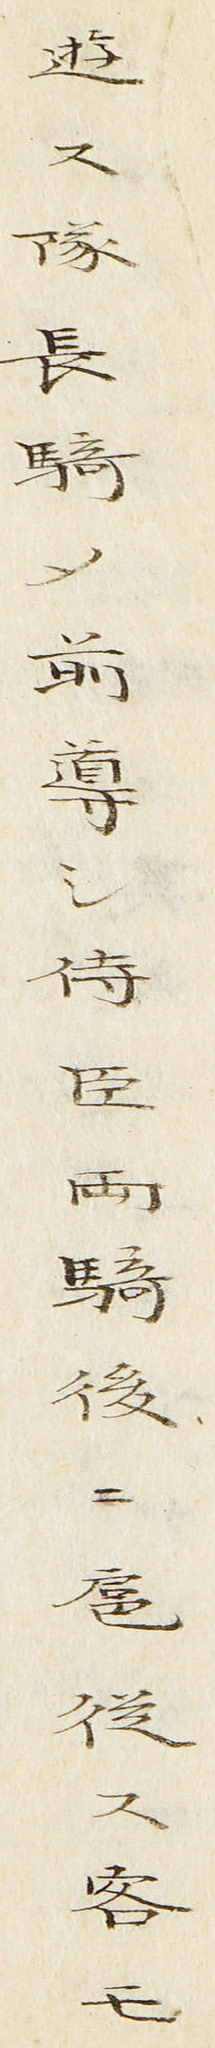遊ス隊長騎シテ前導シ侍臣両騎後ノ扈従ス客モ
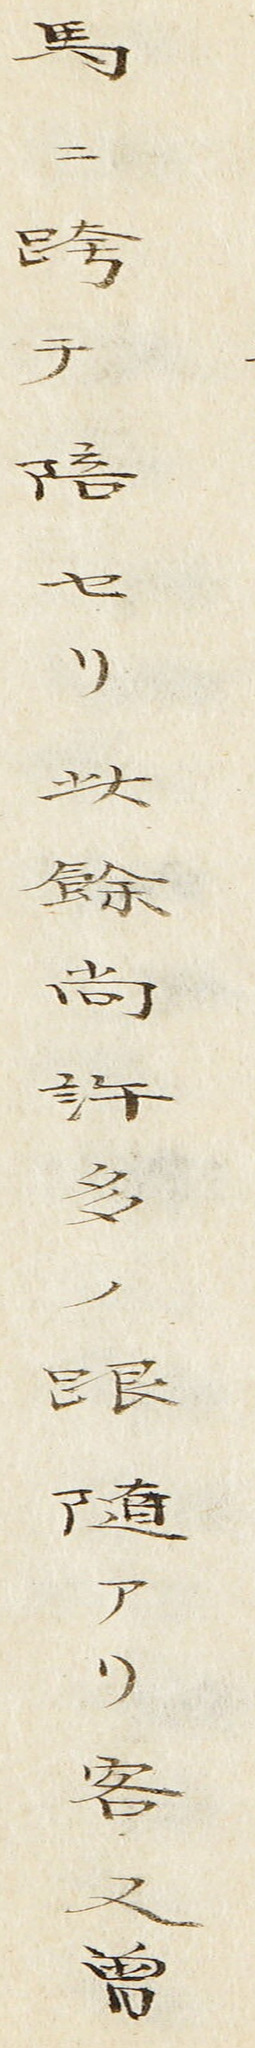馬ニ跨テ陪セリ此余尚許多ノ跟随アリ客又曽
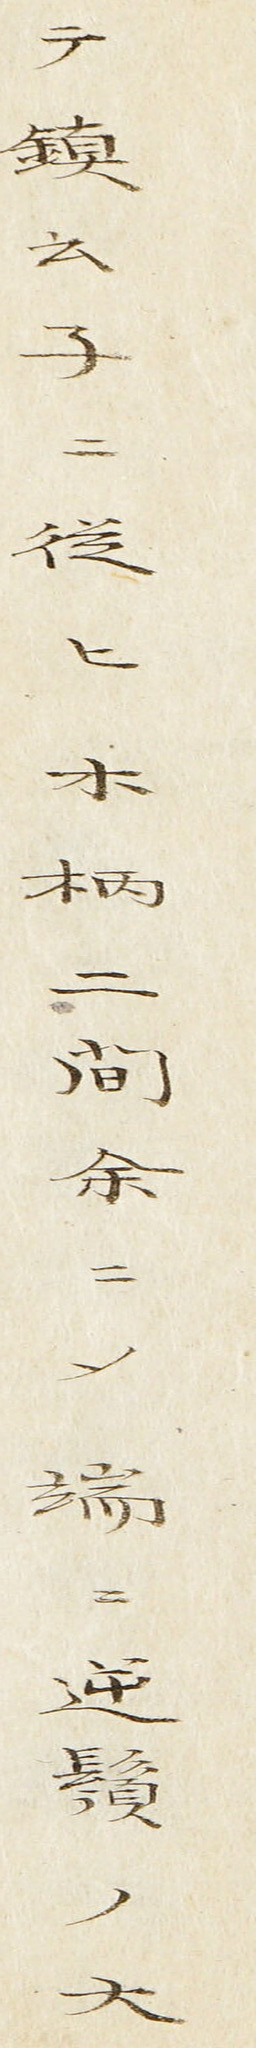テ鎮云子ニ従ヒ木柄二間余ニシテ端ニ逆鬚ノ大
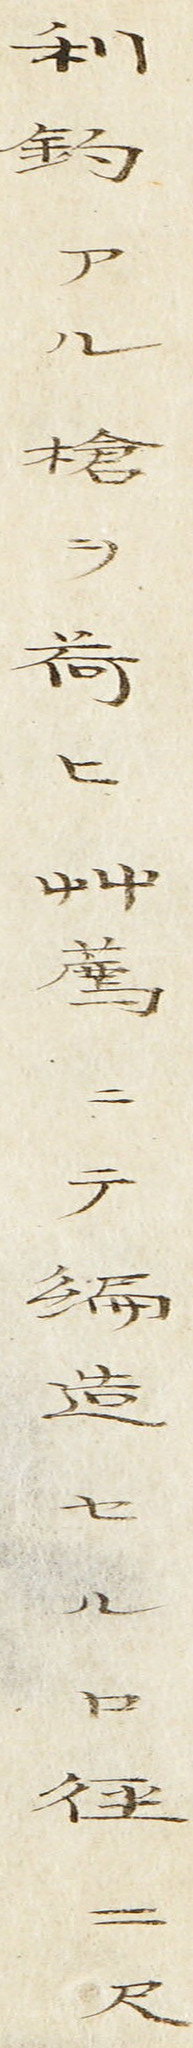利釣アル槍ヲ荷ヒ草薦ニテ編造セル口径ニ尺
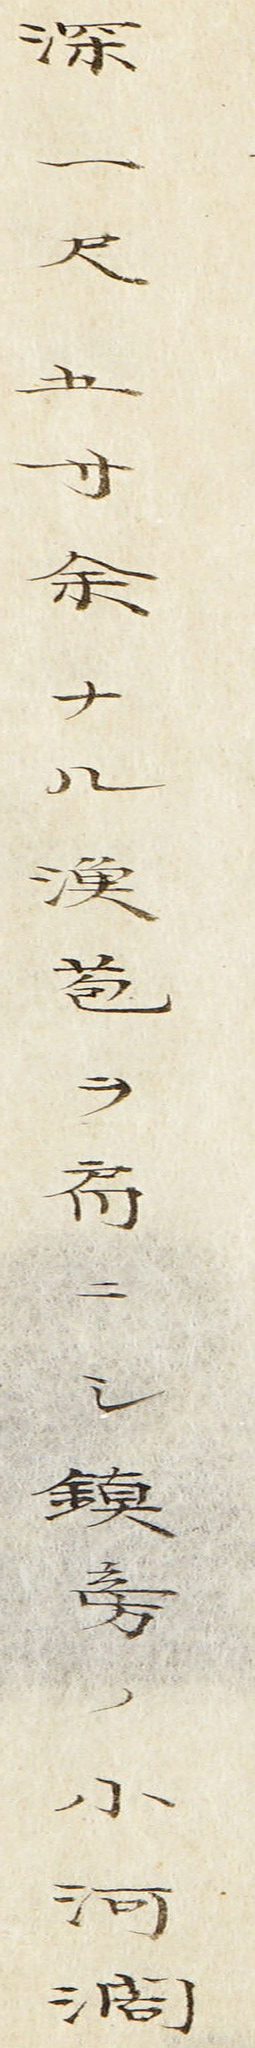深一尺五寸余ナル漁苞ヲ肩ニシ鎮旁ノ小河濶
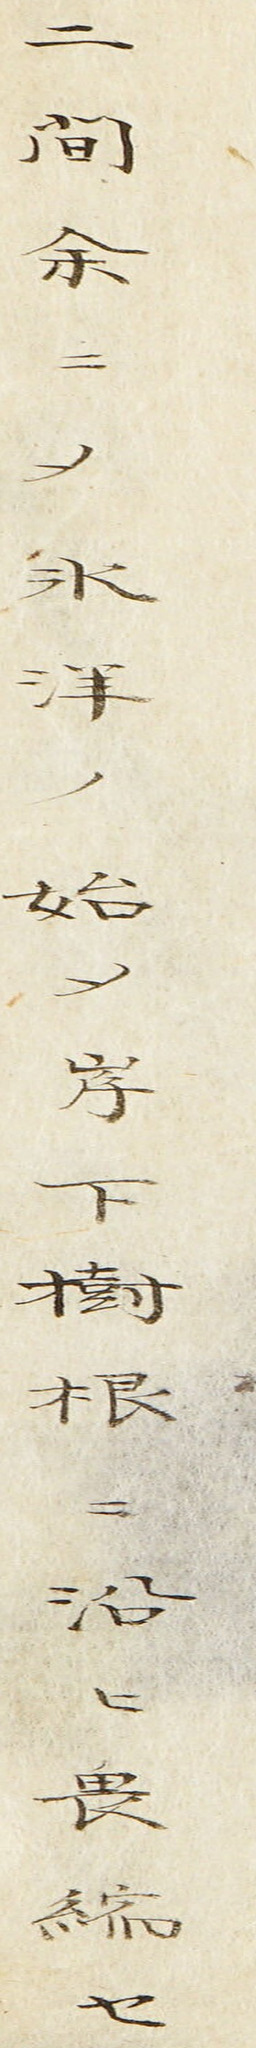ニ間余ニシテ氷洋ノ始シテ岸下樹根ニ沿ヒ畏縮セ
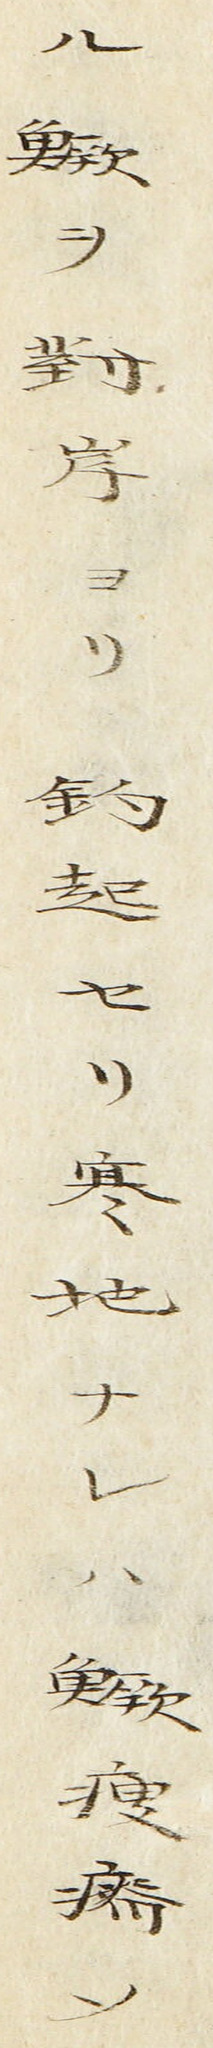ル鱖ヲ対岸ヨリ釣起セリ寒地ナレハ鱖痩瘠シテ

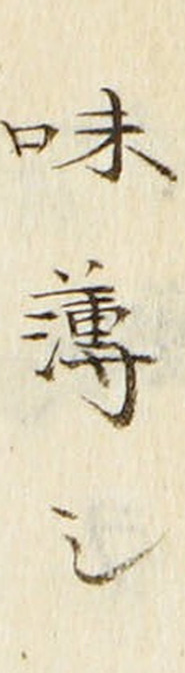味薄シ
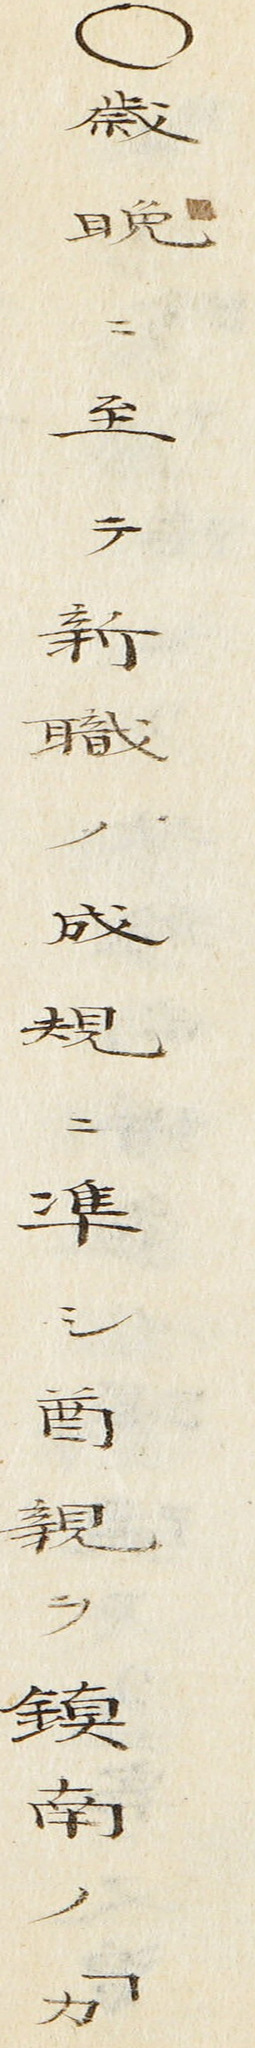〇歳盤晩ニ至テ新職ノ成規ニ準シ酋親ヲ鎮南ノ「カ
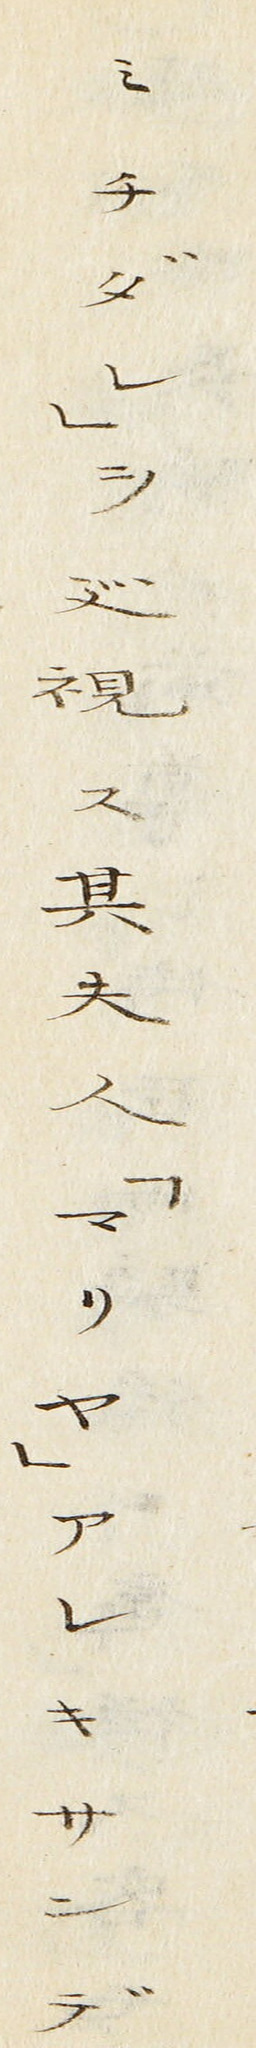ミチダレ」ヲ巡視ス其夫人「マリヤ」アレキサンデ
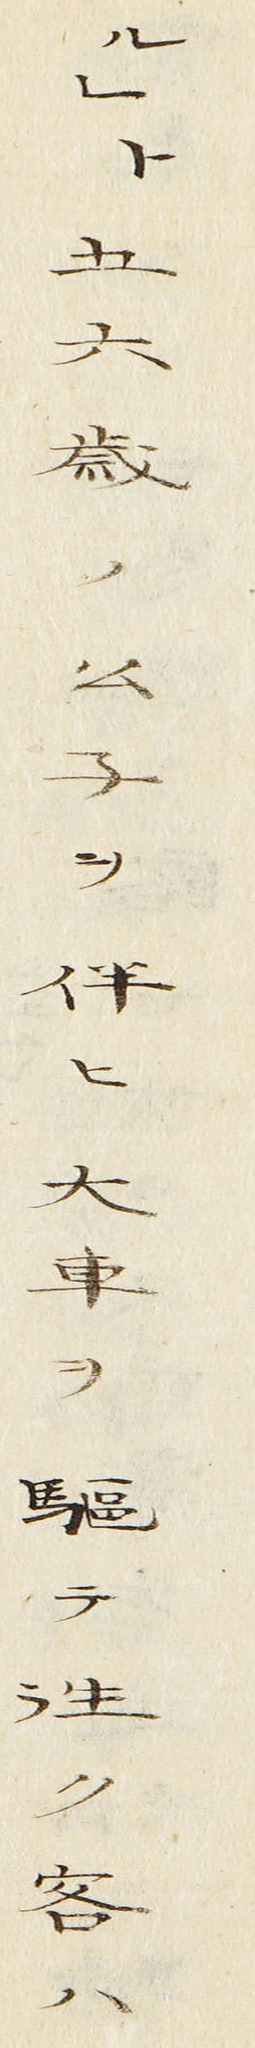ル」ト五六歳ノ公子ヲ伴ヒ大車ヲ駆テ往ク客ハ
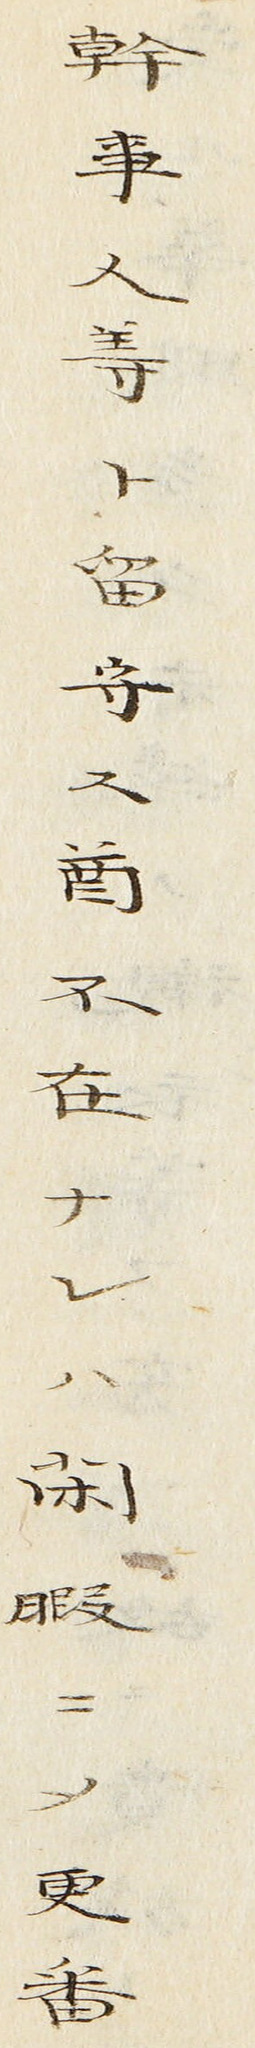幹事人等ト留守ス酋不在ナレハ閑暇ニシテ更番
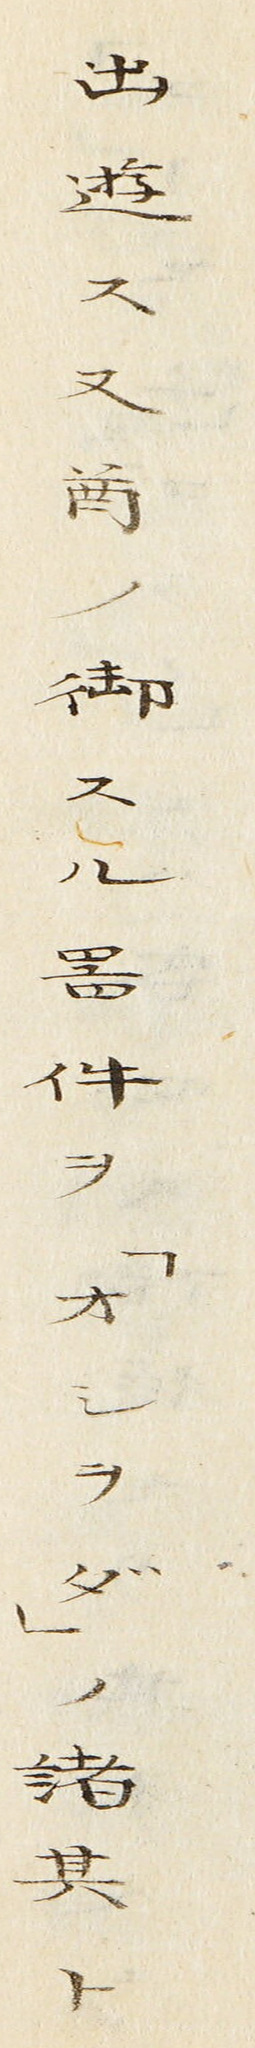出遊ス又酋ノ御スル器件ヲ「オシヲダ」ノ諸其ト
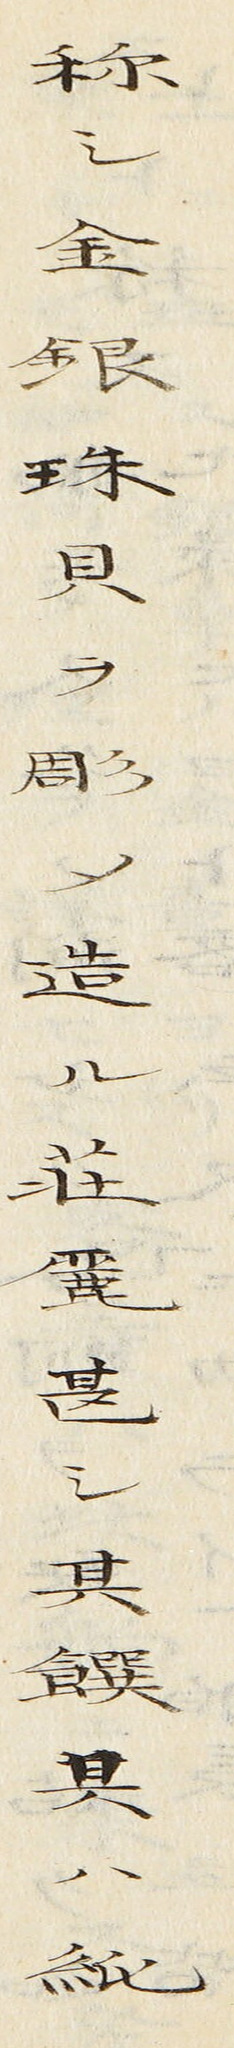称シ金銀珠貝ヲ彫シテ荘麗甚シ其饌其ハ純
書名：蕃談
